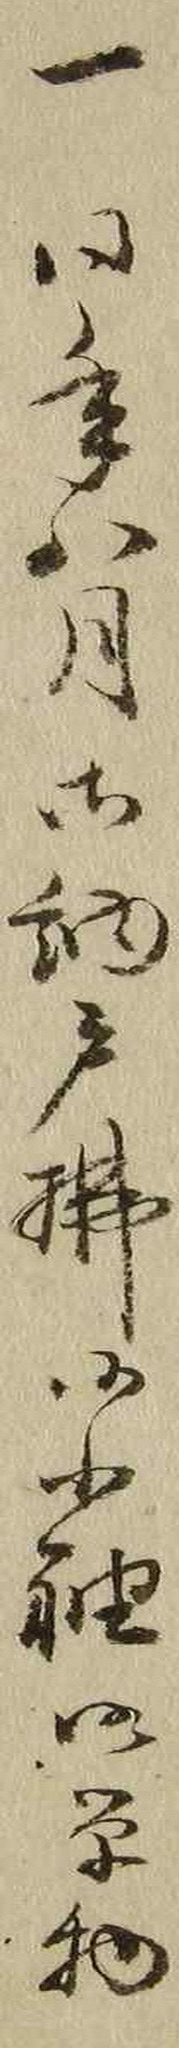一同年八月御納戸払御小袖御単物
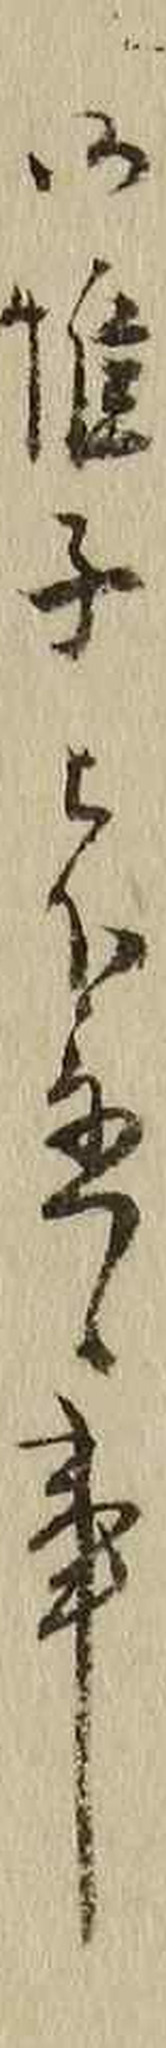御碓子被下置候事
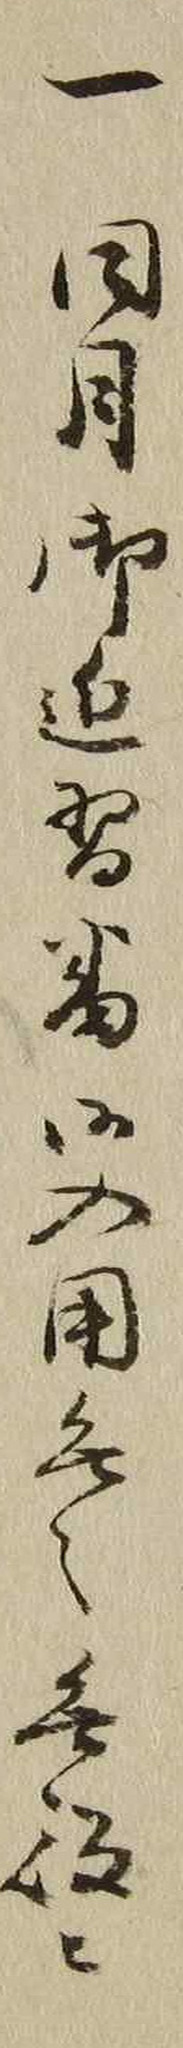一同月御近習番御入用無之無役被
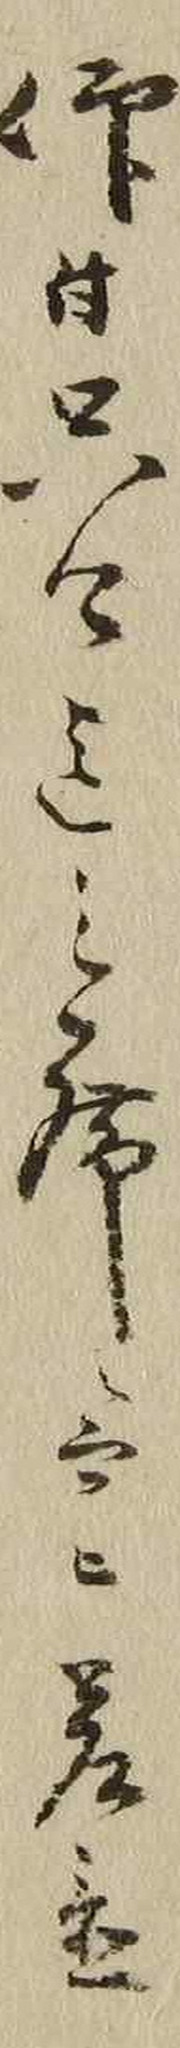仰付只今迄之席ニ而被差置
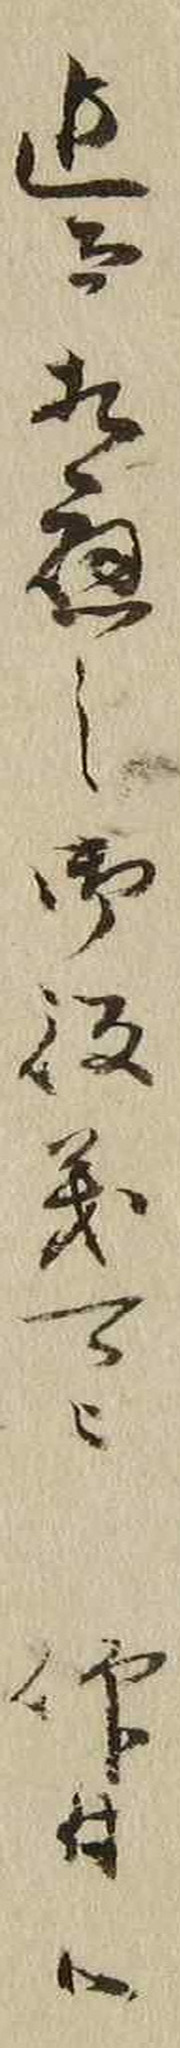追而相応之御役義可被仰付候
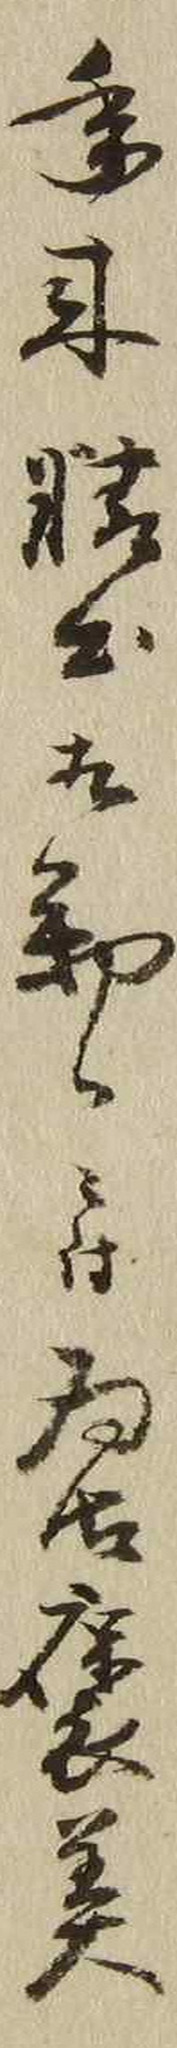年来精出相勤候ニ付為御褒美
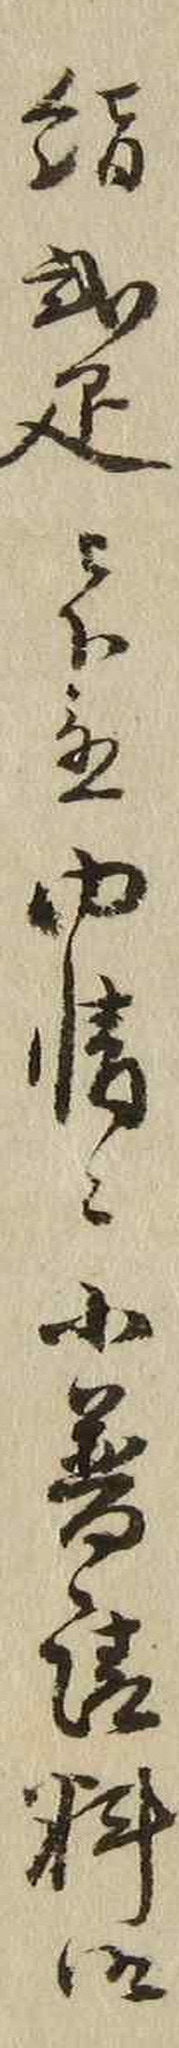絹弐疋被下置内情ニ小普請料御
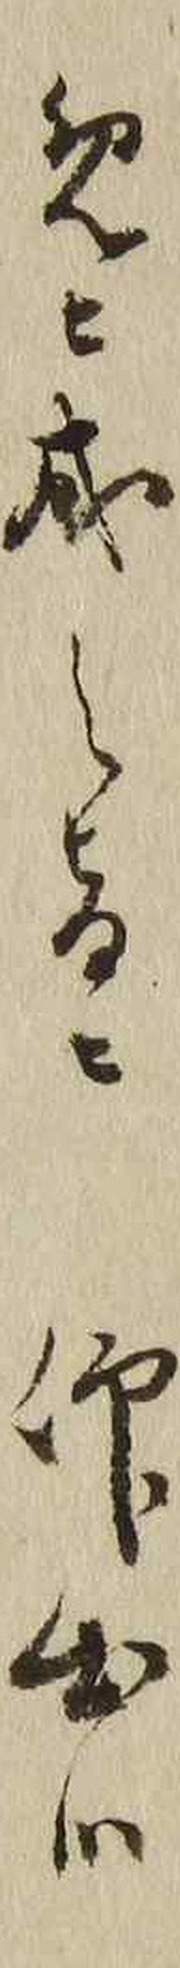免被成之旨被仰出候
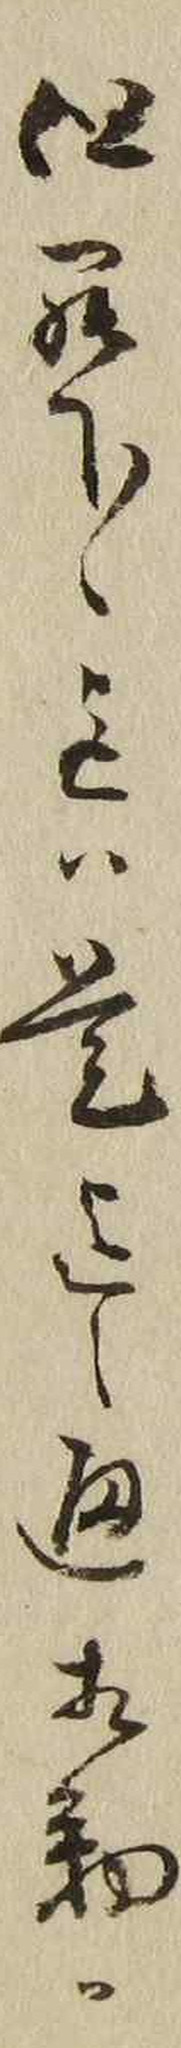但罷下候迄ハ是迄之通相勤候
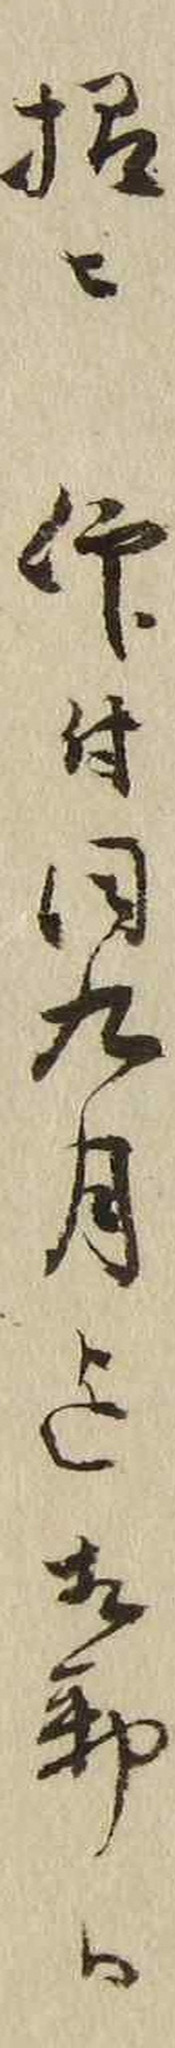様被仰付同九月迄御勤候
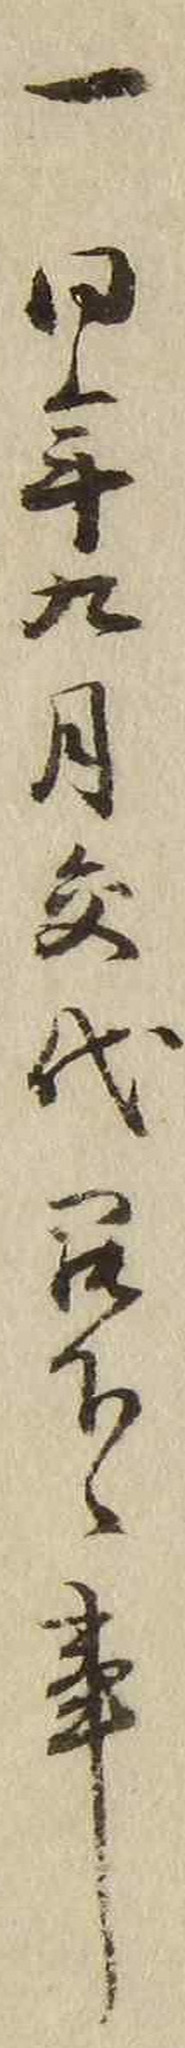一同年九月交代罷下候事

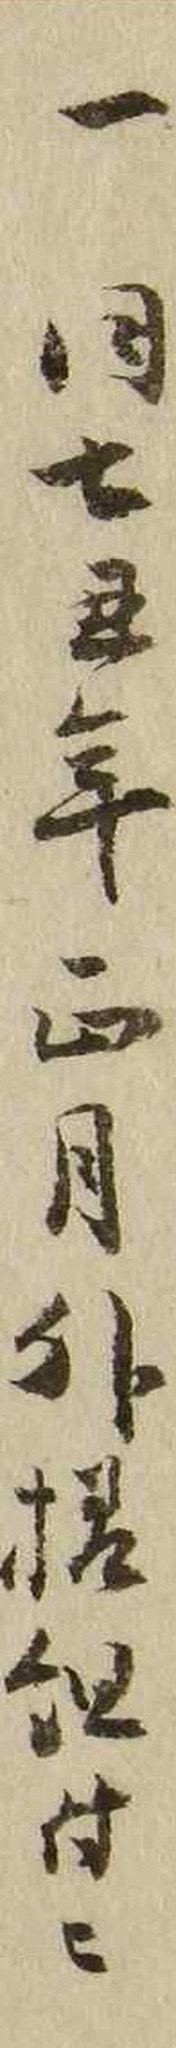一同七丑年正月外様組付被
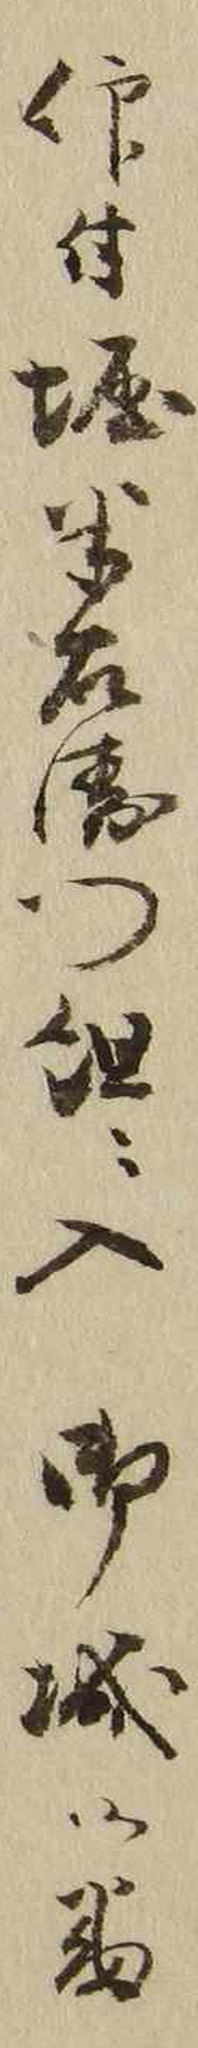仰付堀半右衛門組ニ入御城御番
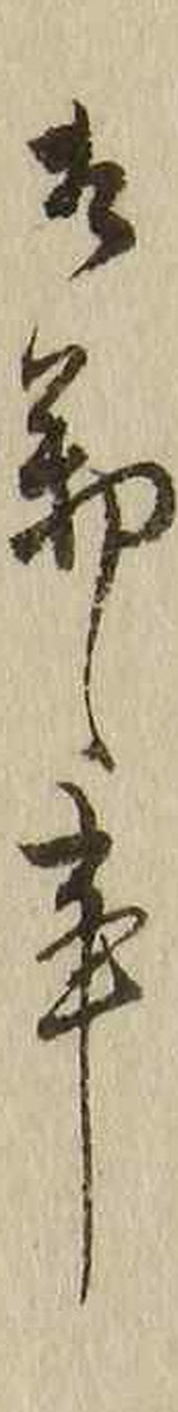相勤候事
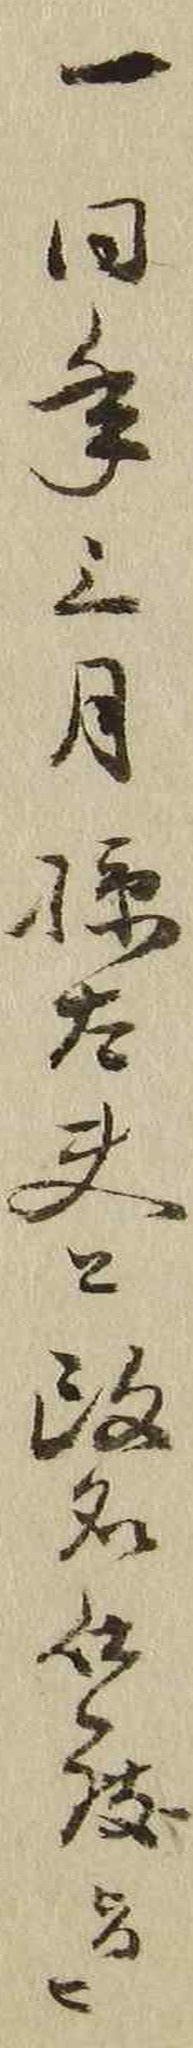一同年三月孫太夫と改名仕度旨被
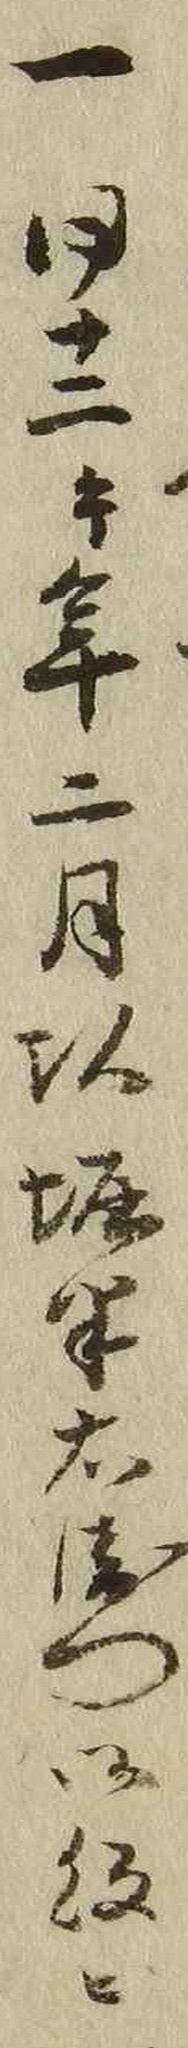一同十二午年二月頭堀半右衛門御役被
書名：諸士系譜　巻之232　け之部1
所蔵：会津若松市立会津図書館
